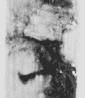之
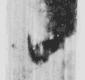口
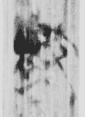毀
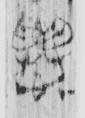{與心}
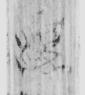{水山一王}
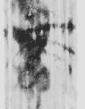而
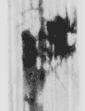{言丵又}
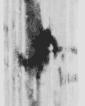之
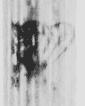則
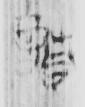請
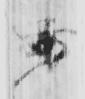可
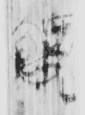智
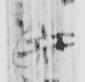母
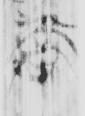喬
